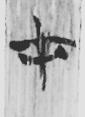才
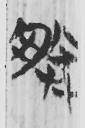朕
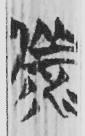備
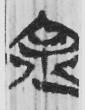余
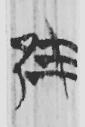隹
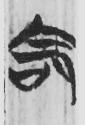命
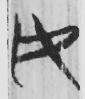女
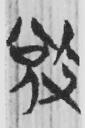敓（說）
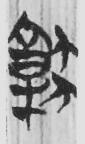{享䖵}
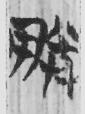朕
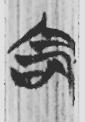命
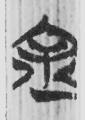余
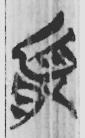{肉頁}
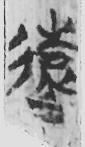遠
